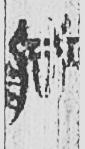戕
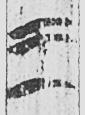王
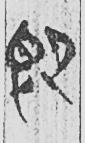即
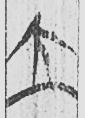立
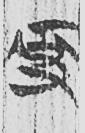史
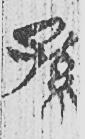孫
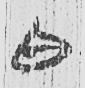白
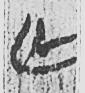亡
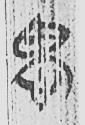愄
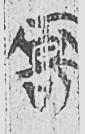{口甹}
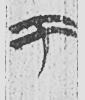于
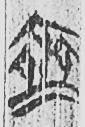齊
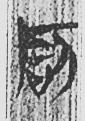叚
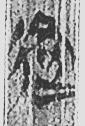{辶各}
